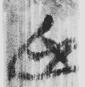臣
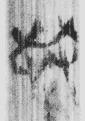共
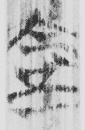命
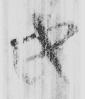女
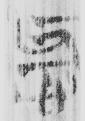怠
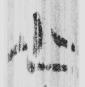少
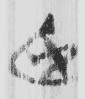臣
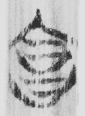合
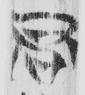君
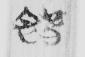既
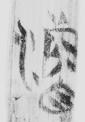濬
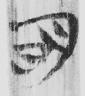明
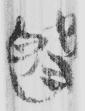既
